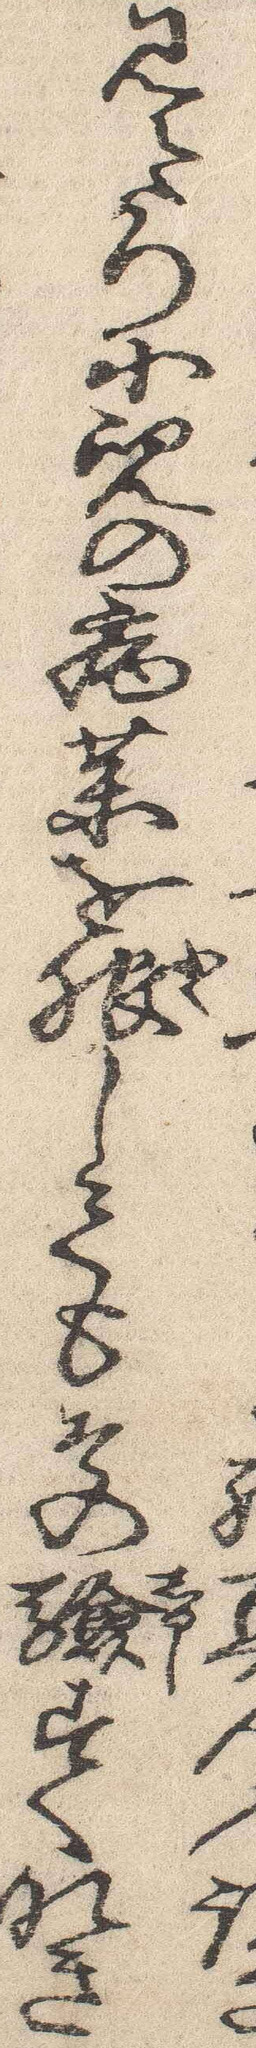見えたり小児の病薬を服してもその験すくなき
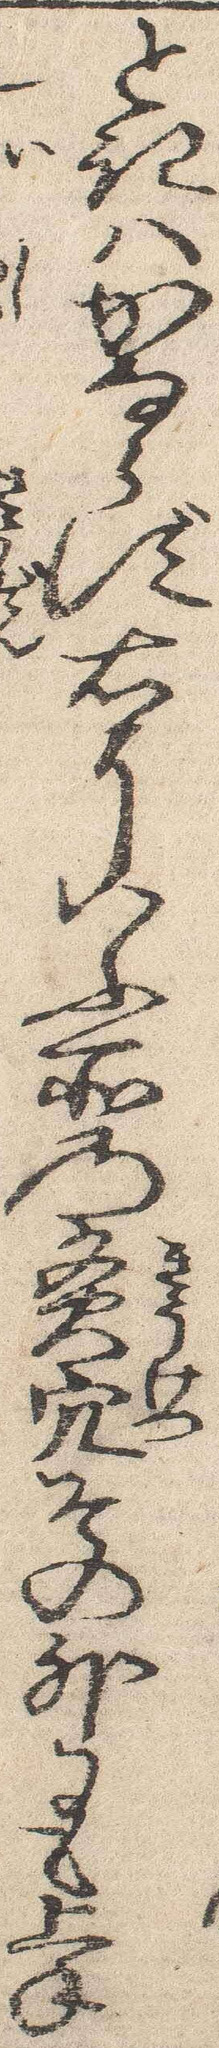ときはかならず右にいふと所の灸穴その外にも上手
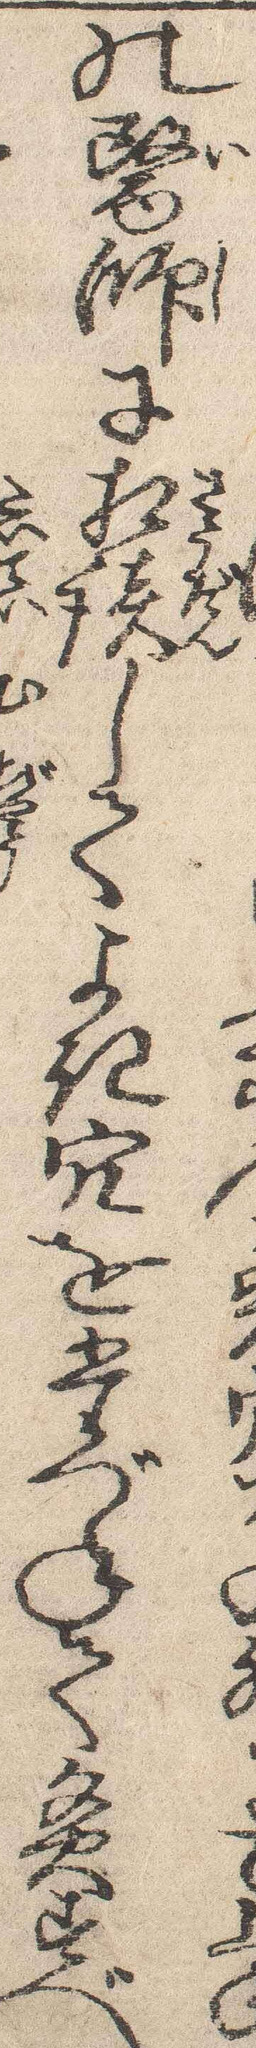の医師に相談してよき穴をたづねて灸すべ
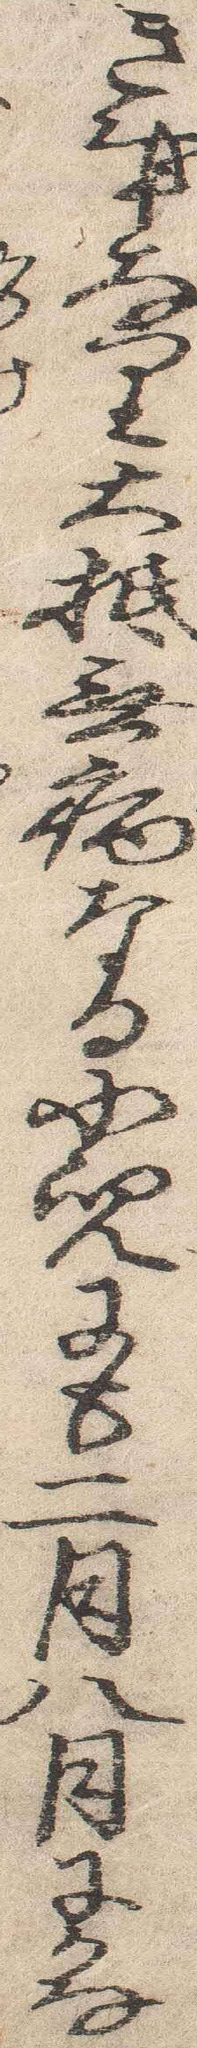き事なり大抵無病なる小児にも二月八月にかな
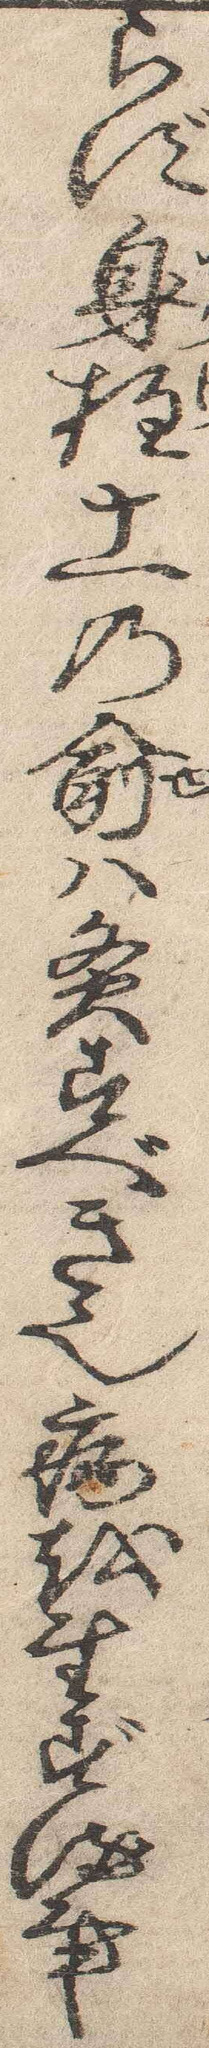らず身柱十一の兪は灸すべき也病を生ずる事
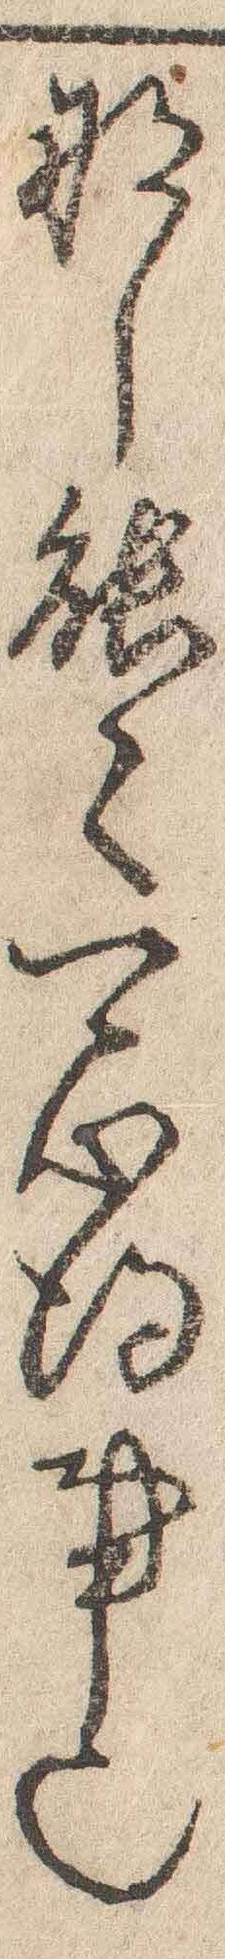なし能々可心得事也

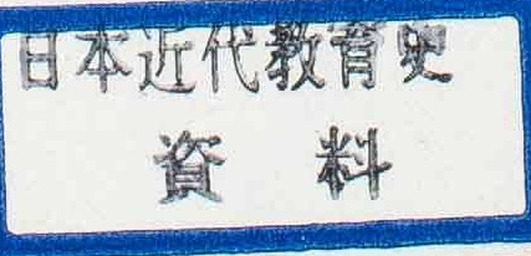日本近代教育史

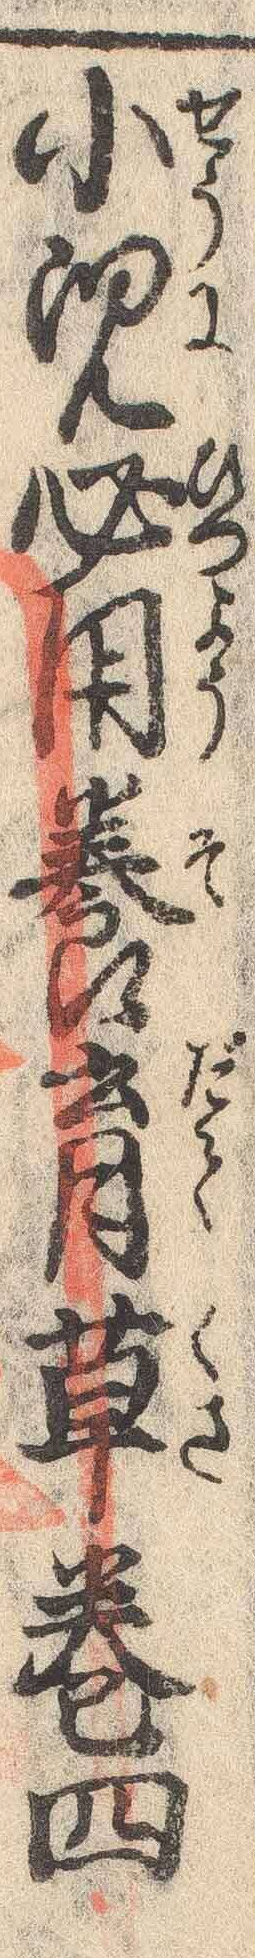小児必用養育草巻四
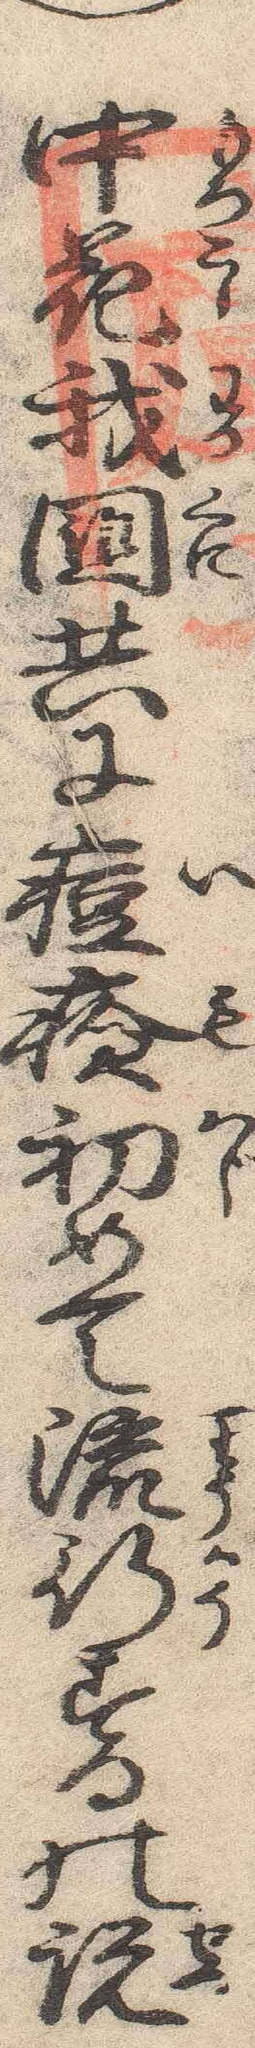㊀中花我国共に痘瘡初めて流行するの説
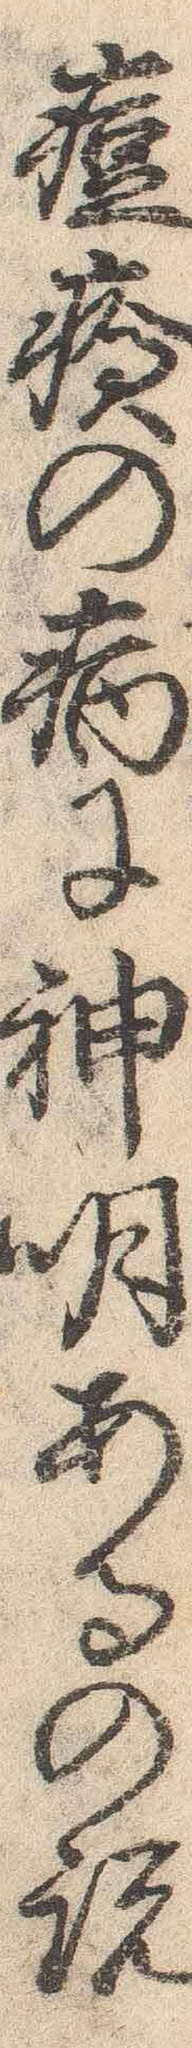㊁痘瘡の病に神明あるの説
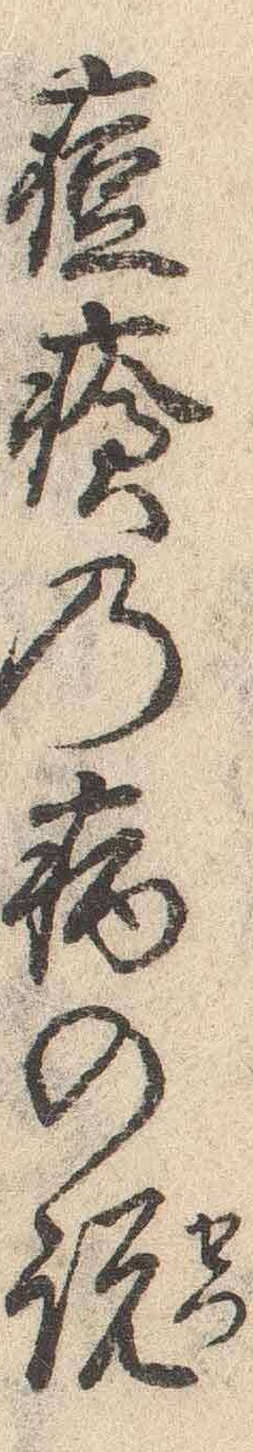㊂痘瘡の病の説
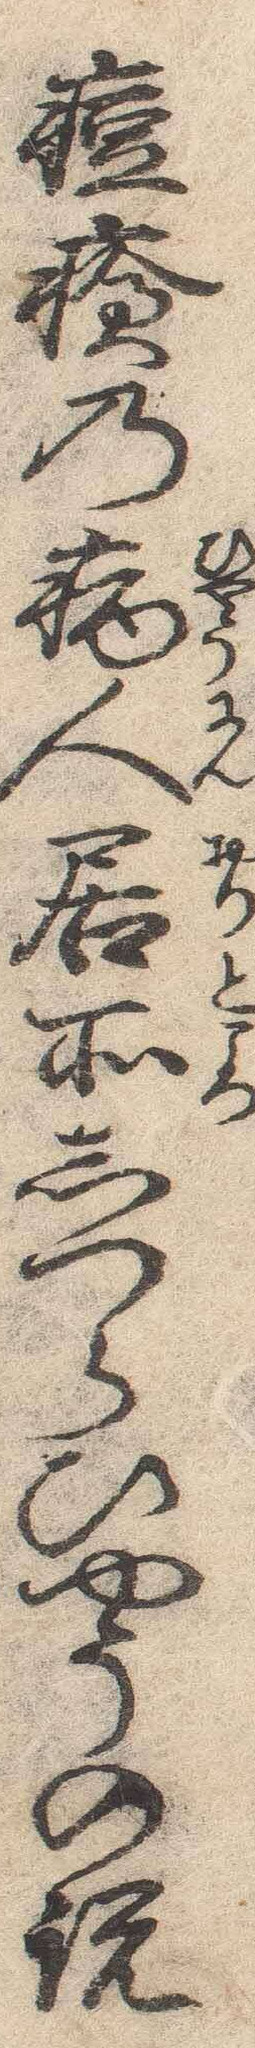㊃痘瘡の病人居所しつらひやうの説
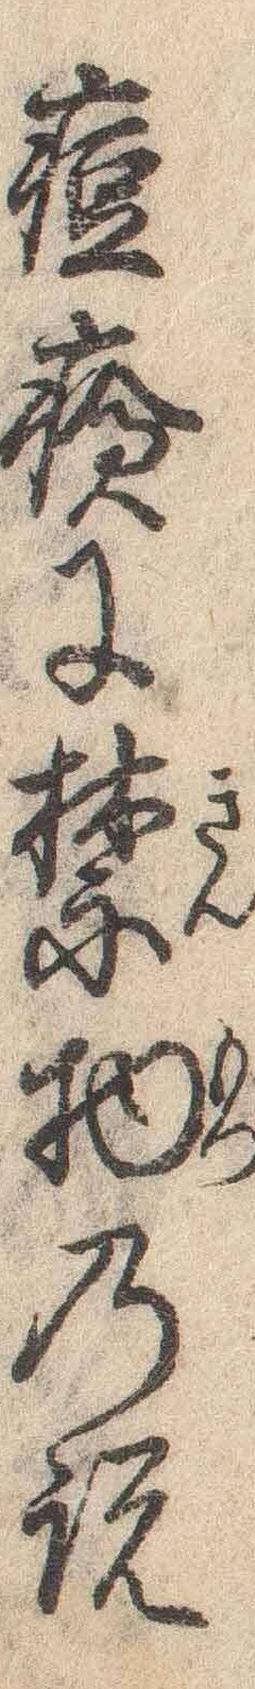㊄痘瘡に禁物の説
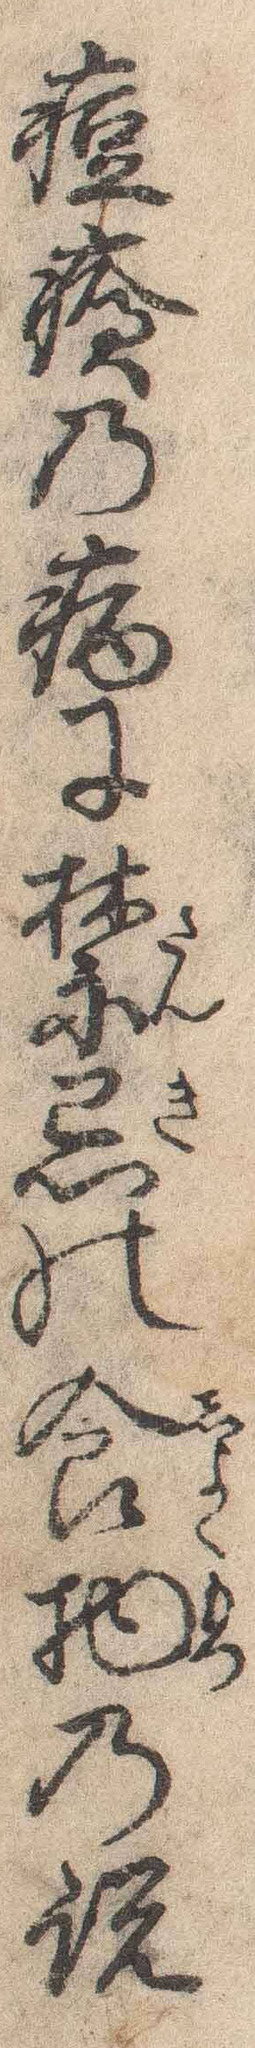㊅痘瘡の病に禁忌の食物の説

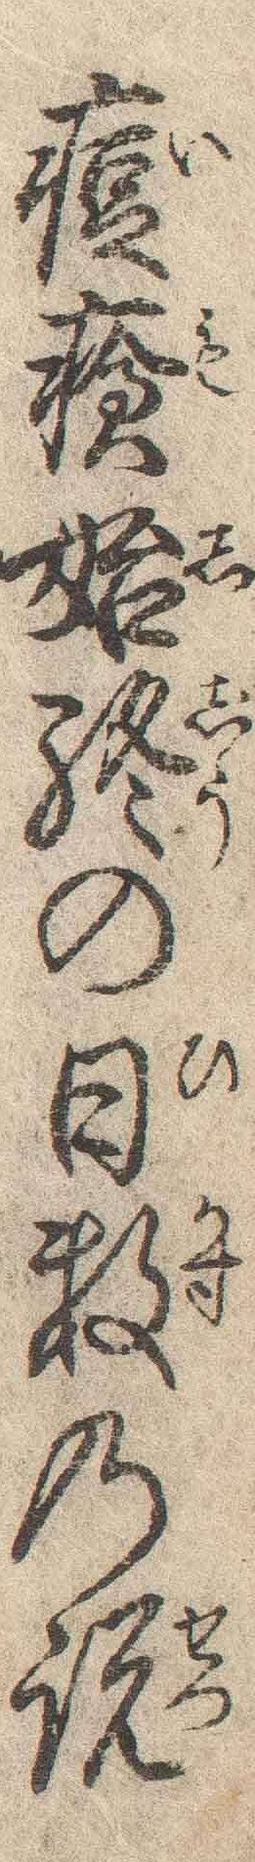㊆痘瘡始終の日数の説
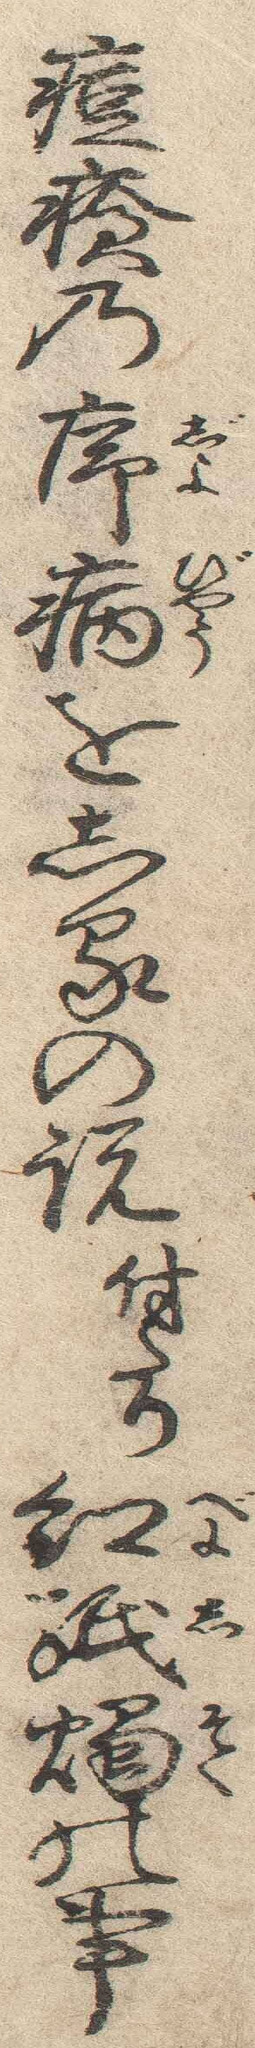㊇痘瘡の序病をしるの説付たり紅紙燭の事
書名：小児必用養育草
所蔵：東京学芸大学附属図書館 国文学研究資料館
